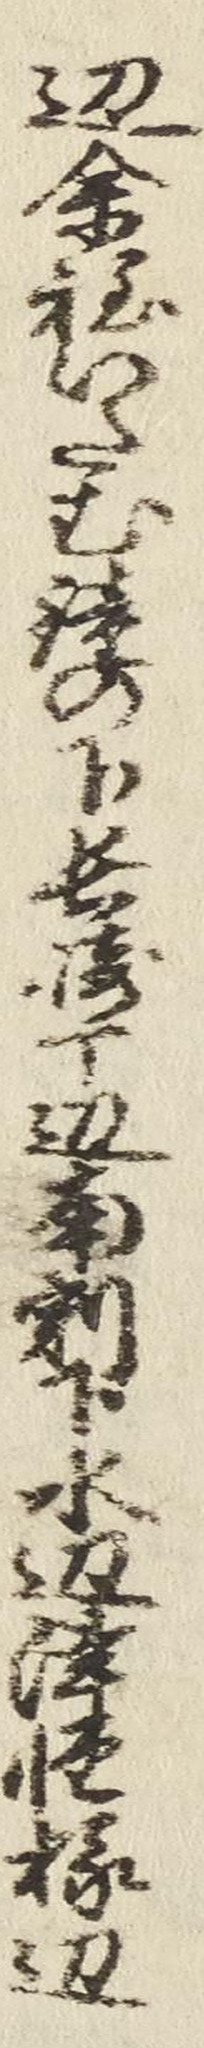辺余程いたむ鐘の下長崎丁辺南割下水津軽様辺
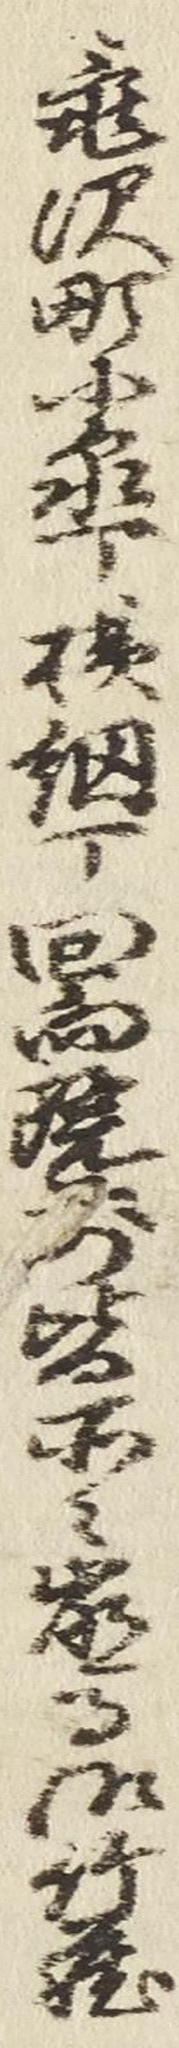亀沢町小泉丁横網丁回向院前皆所々崩る御竹蔵
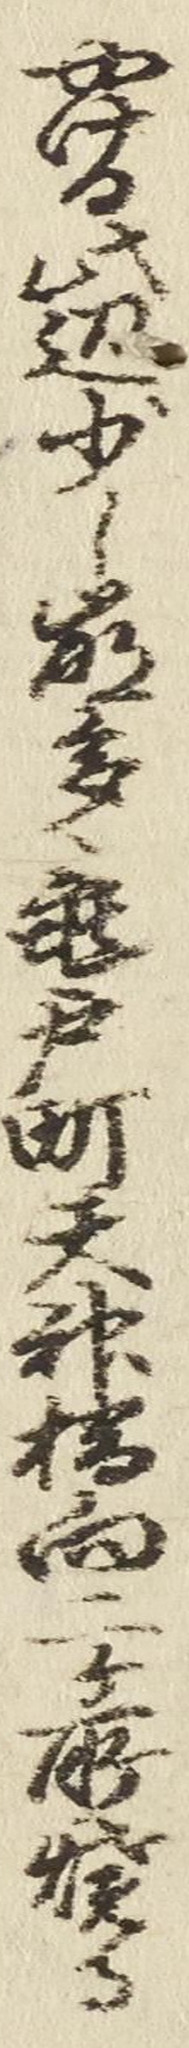辺大川端少し崩多亀戸町天神橋向二ヶ所焼る
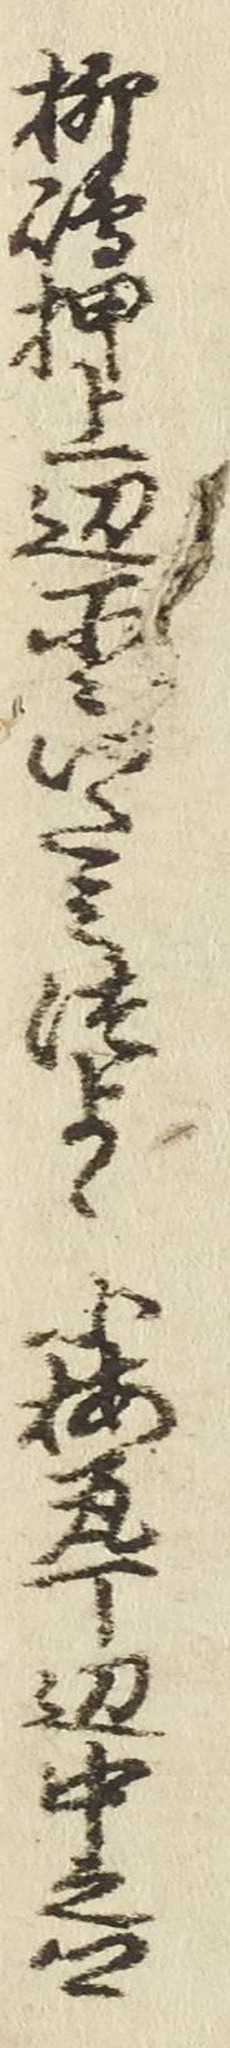柳嶋押上辺所々いたみつよく小梅瓦丁辺中之郷
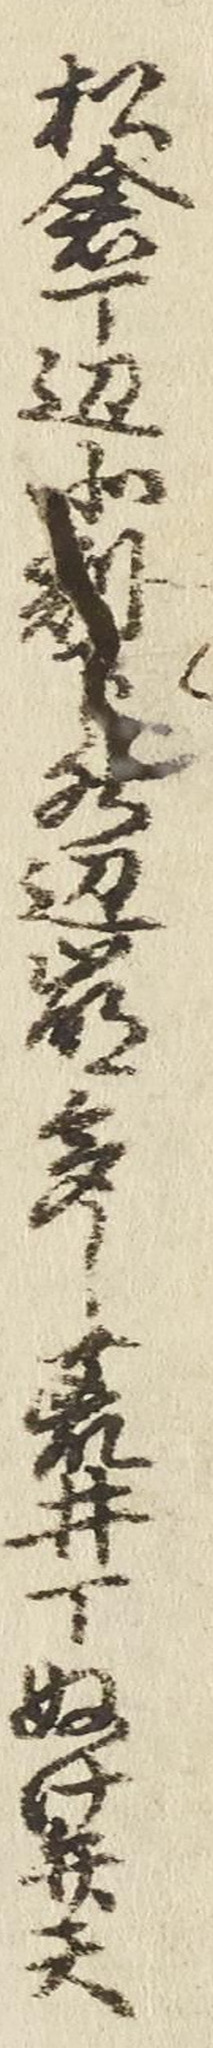松倉丁辺北割下水辺崩多し荒井丁ぬけ弁天
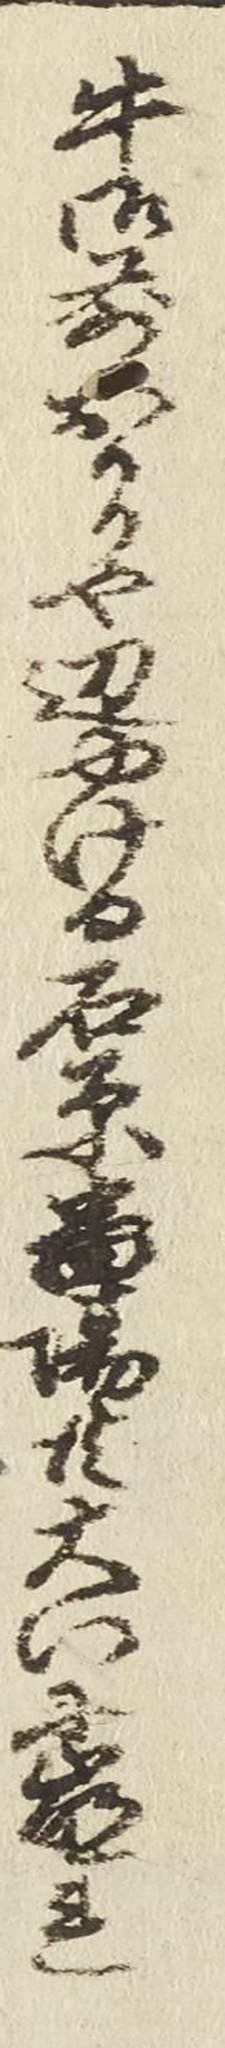牛御前おかりや辺やける石原番場共大いに崩れ
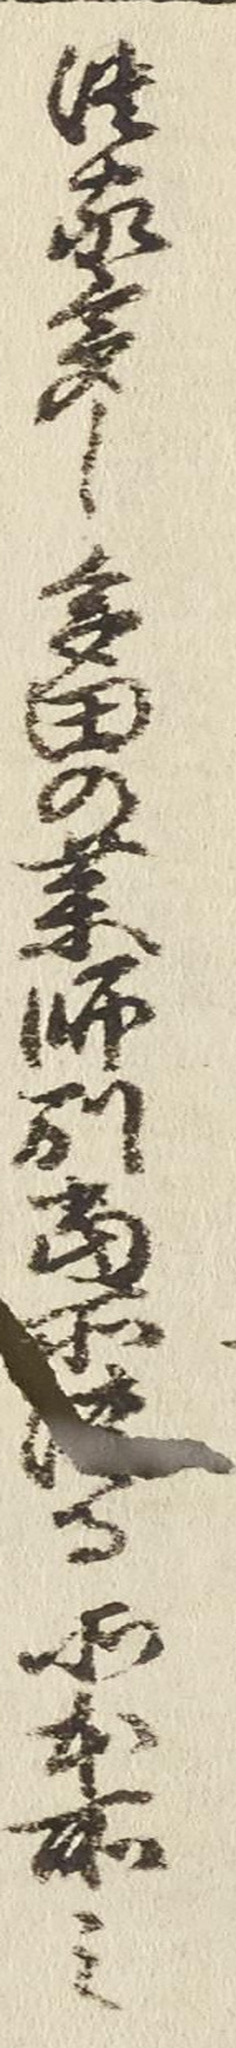潰家多し多田の薬師別当潰る北本所之
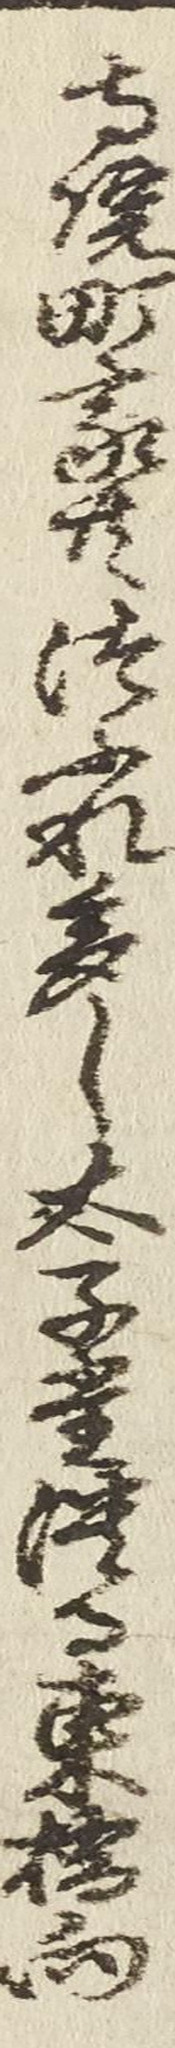寺院町家共つふれ多し太子堂潰る東橋向
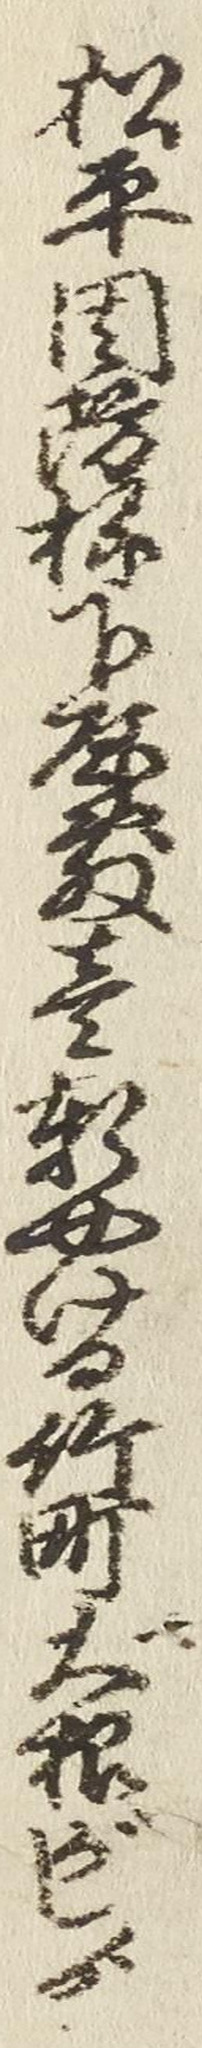松平周防様下屋敷壱軒やける竹町大根がしゟ
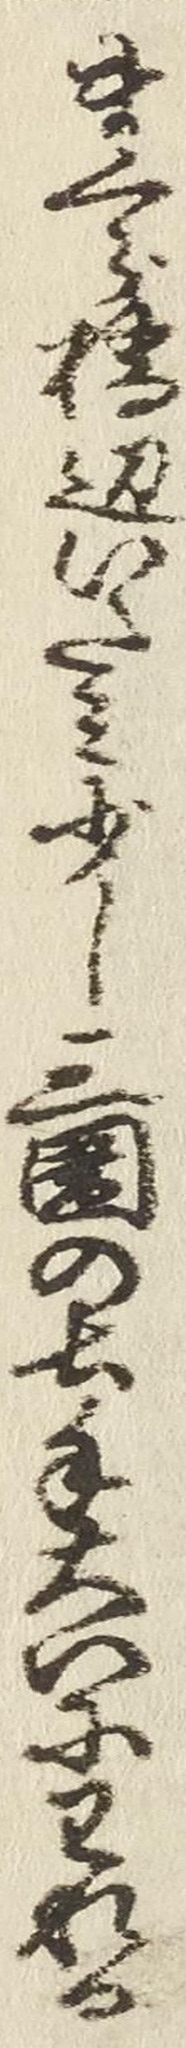まくら橋辺いたみ少し三囲の土手大いにわれる
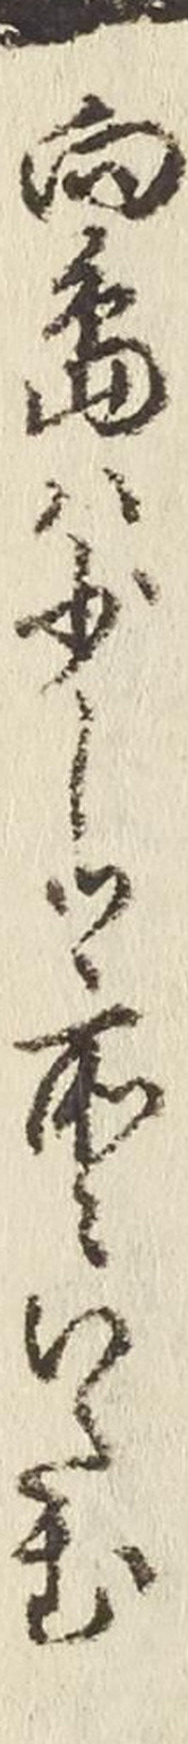向島は少しツヽ所々いたむ
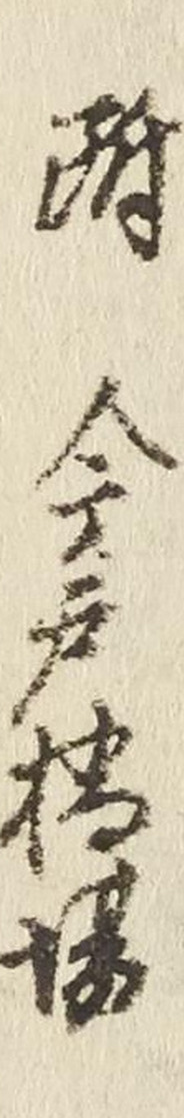附今戸橋場
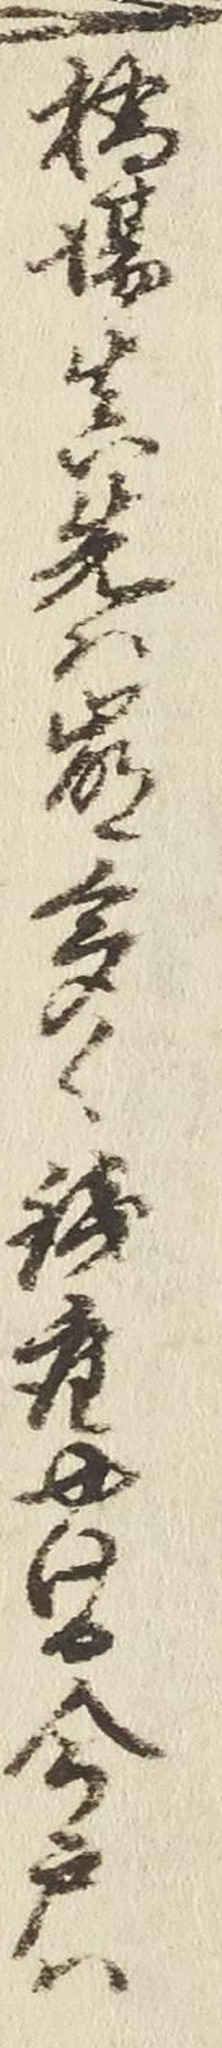橋場真先は崩多く銭座やける今戸は
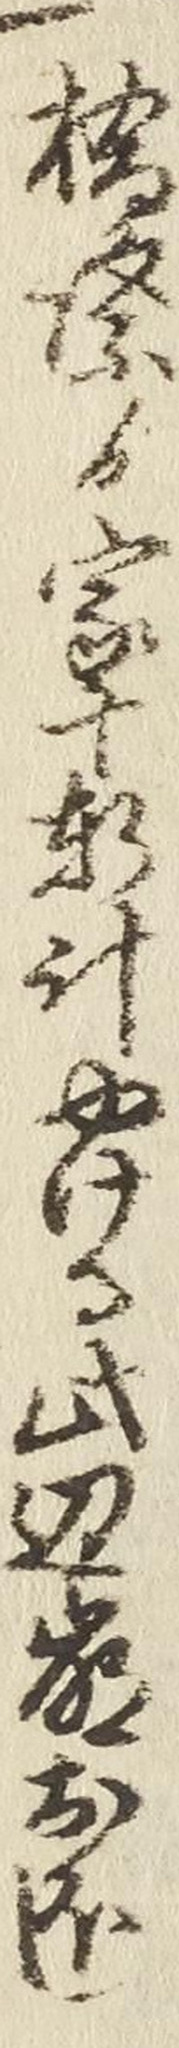橋際ゟ家十軒計やける此辺崩おほし

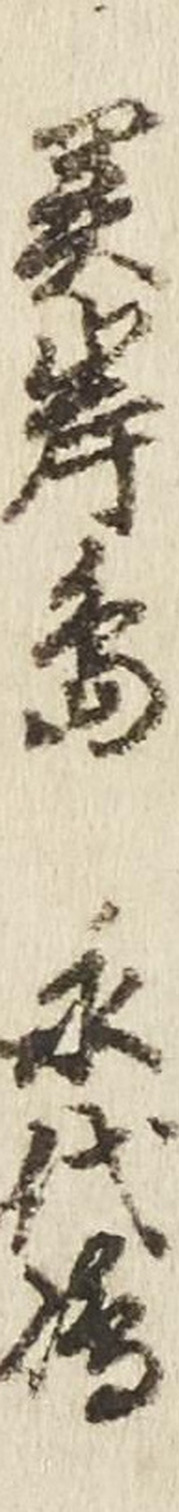○霊岸島永代島
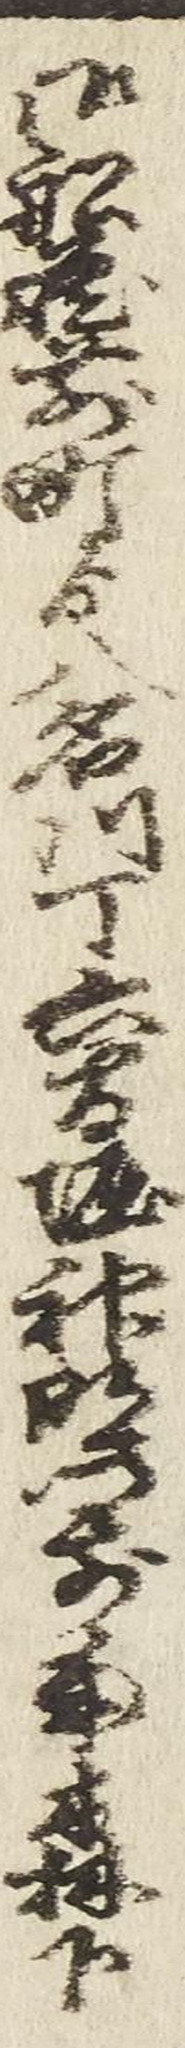御船蔵前町ゟ八名川丁六間堀神明門前南森下
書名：江戸みやげ
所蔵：東京大学地震研究所図書室 Earthquake Research Institute Library, The University of Tokyo, JAPAN
